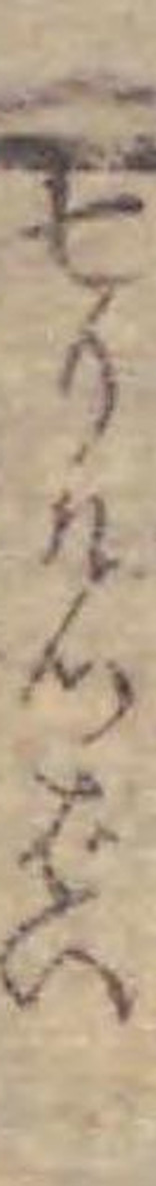七りけつばい
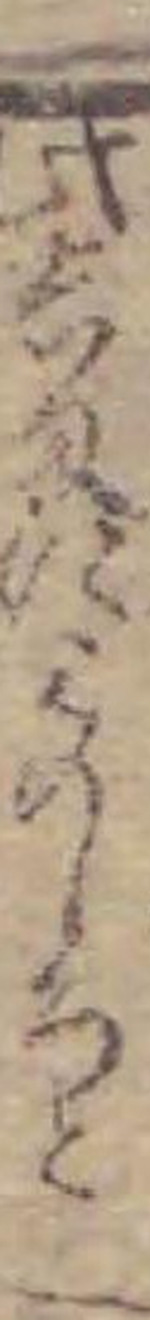此しまにみのしろと
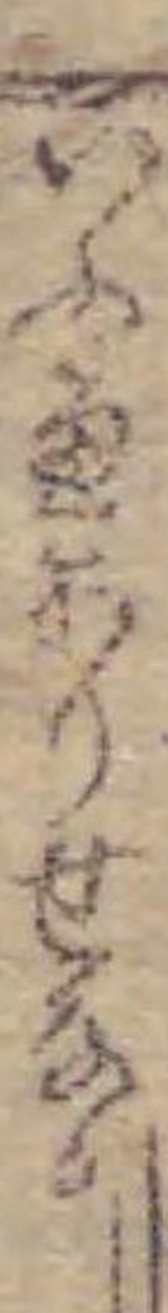いふ魚ありせなか
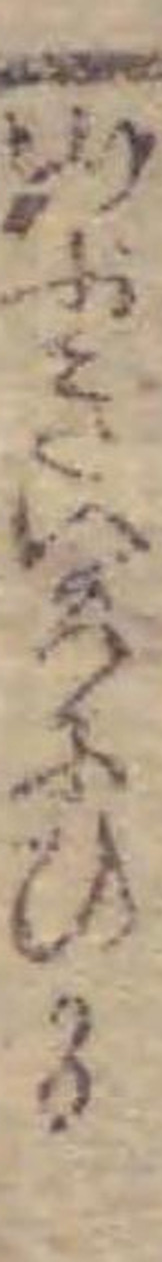山ふきいろにひかる
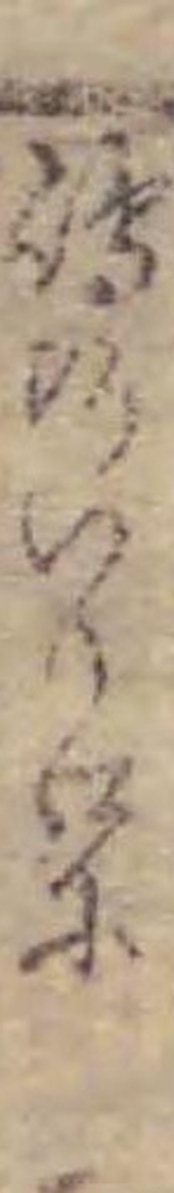島のいり口に
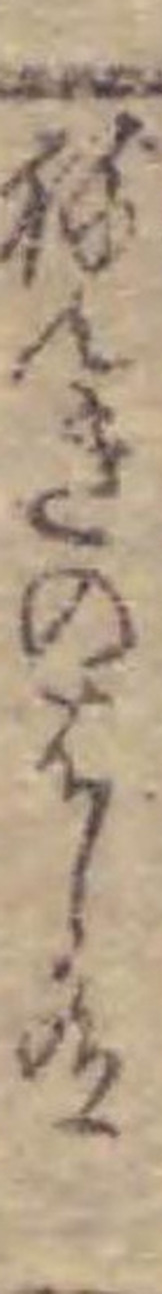ねんきのはし有
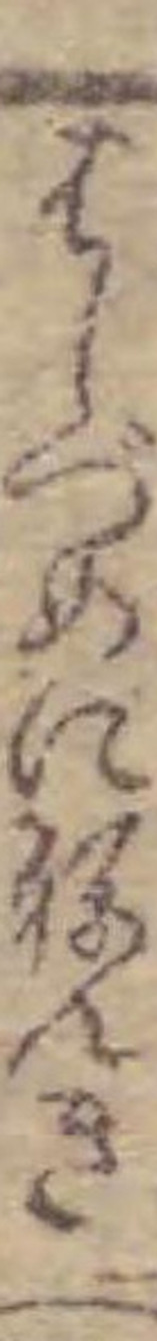はしづめにねんき
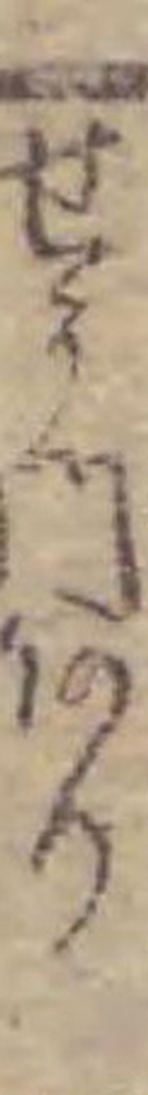せう門あり
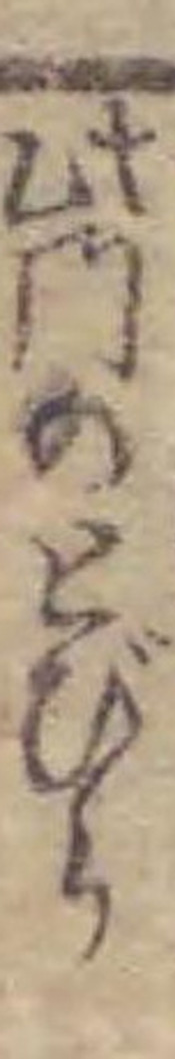此門のとびら
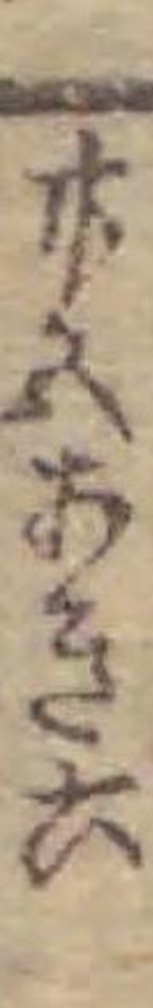廿五あき六
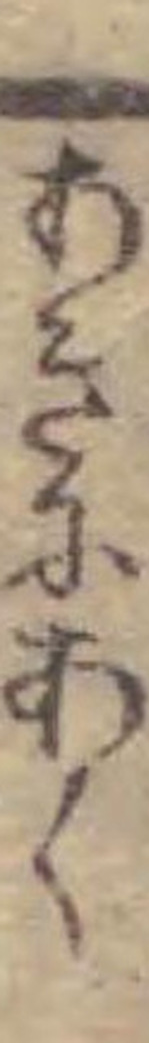あきにあく
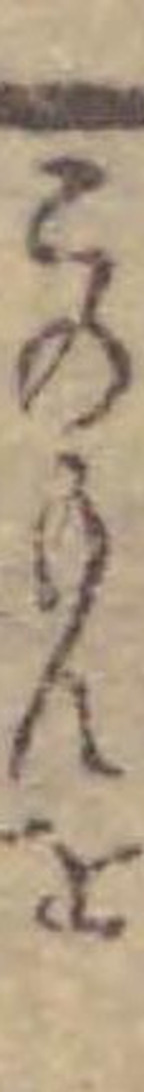このもんを
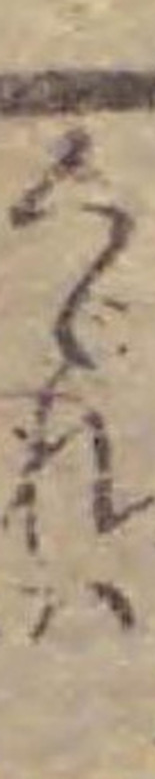くゞれは
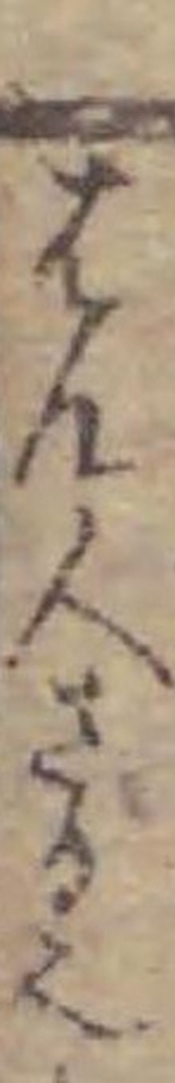はん人さる也
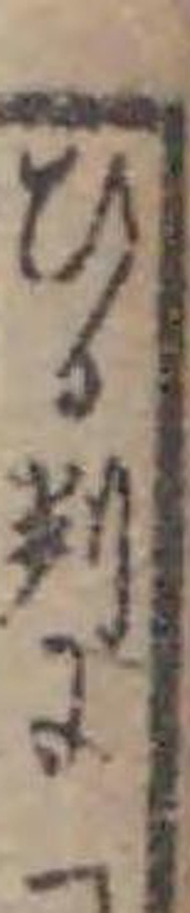ひる判に
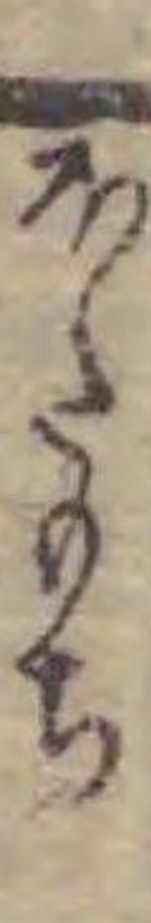ほたもち
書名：北国順礼唄方便 : 3巻
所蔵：国立国会図書館 National Diet Library, JAPAN
